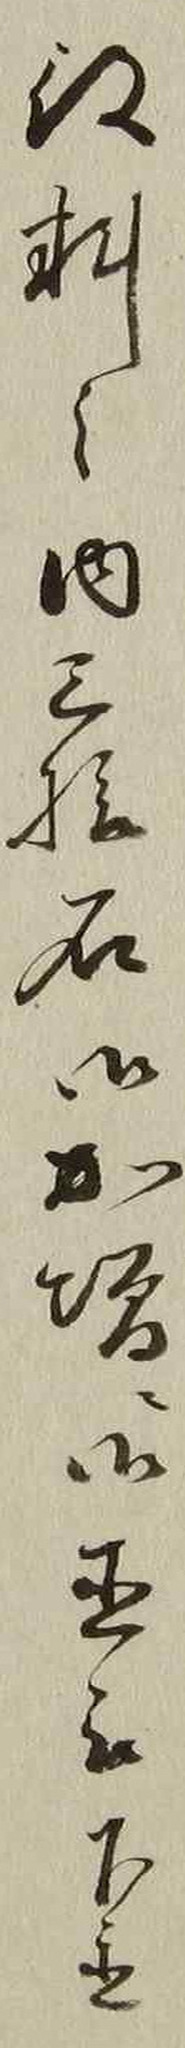役料之内三拾石御加増ニ御直被下置
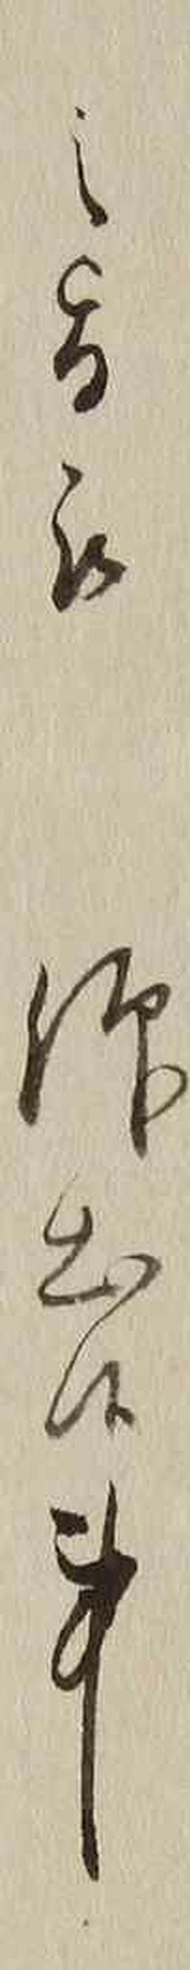之旨被仰出候事
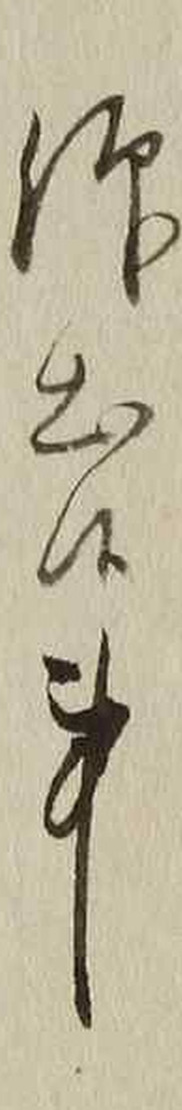仰出候事
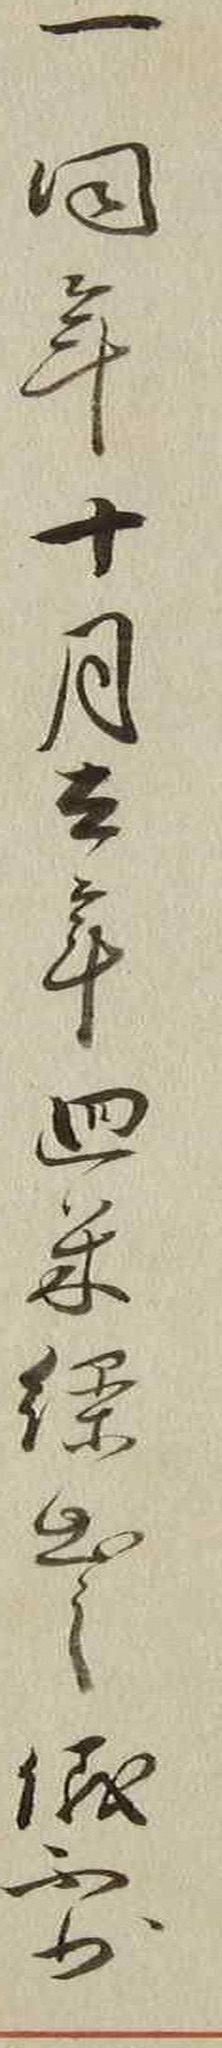一同年十月去年廻米繰出之儀不少
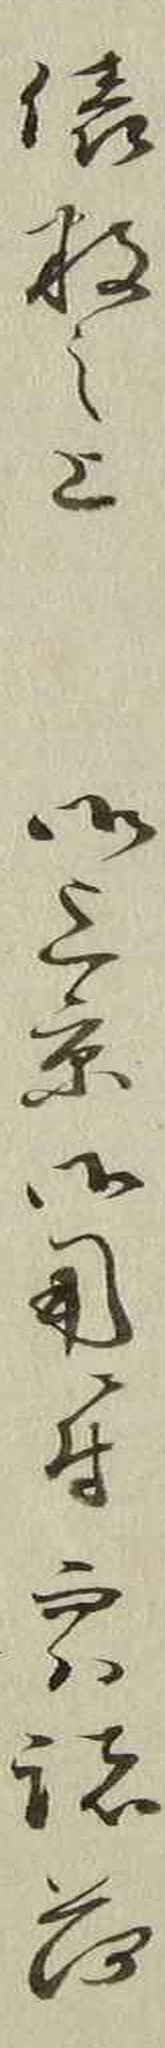俵数之上御上京御用ニ付而ハ諸荷
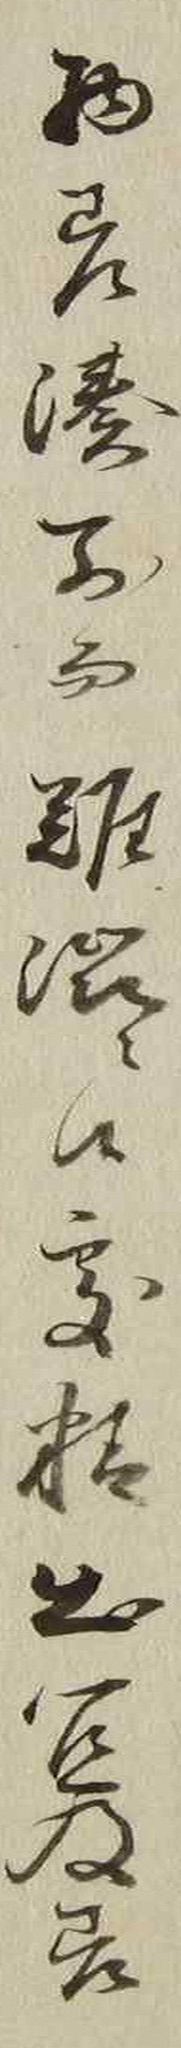物差湊別而難渋ニ候処精出宜及差
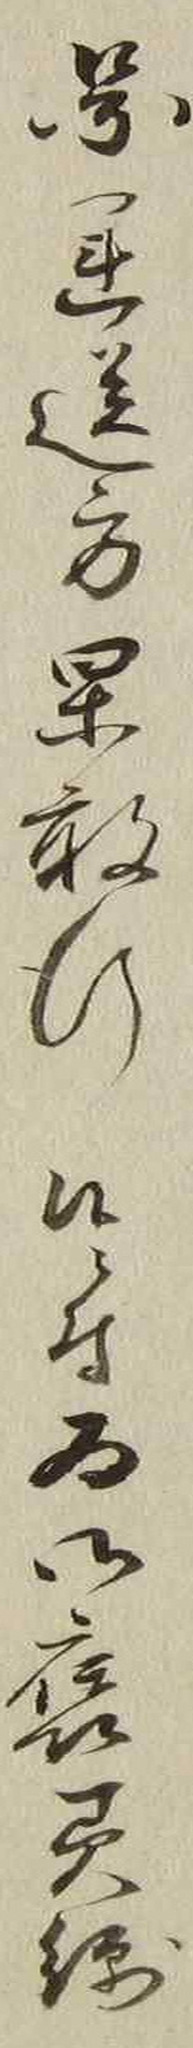図運送方果敢行候ニ付為御褒美綿
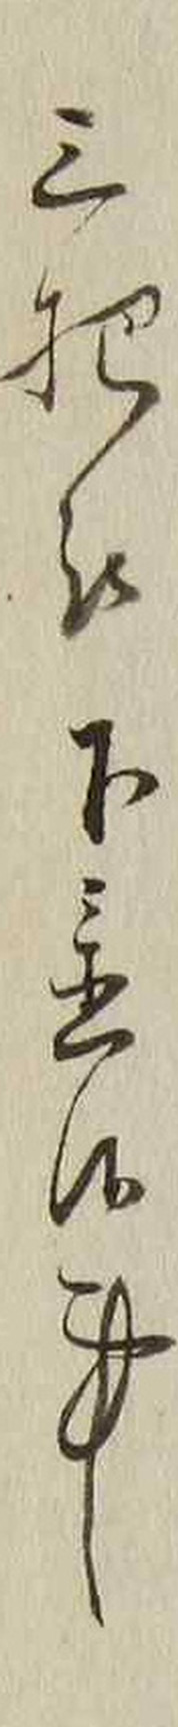三把被下置候事
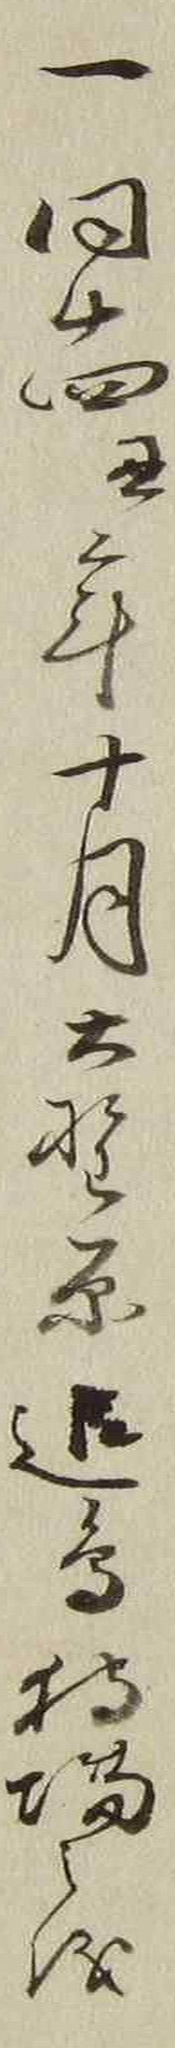一同十四丑年十月大野原追鳥狩場之儀
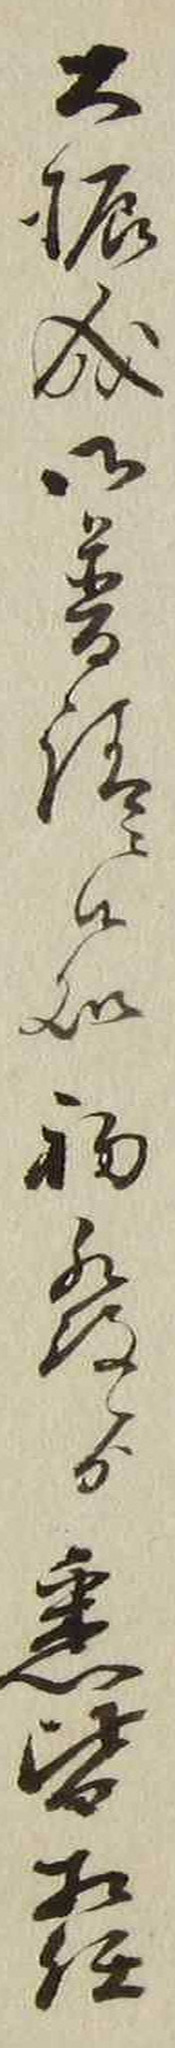大振成御普請ニ候処初発ゟ悉皆相任
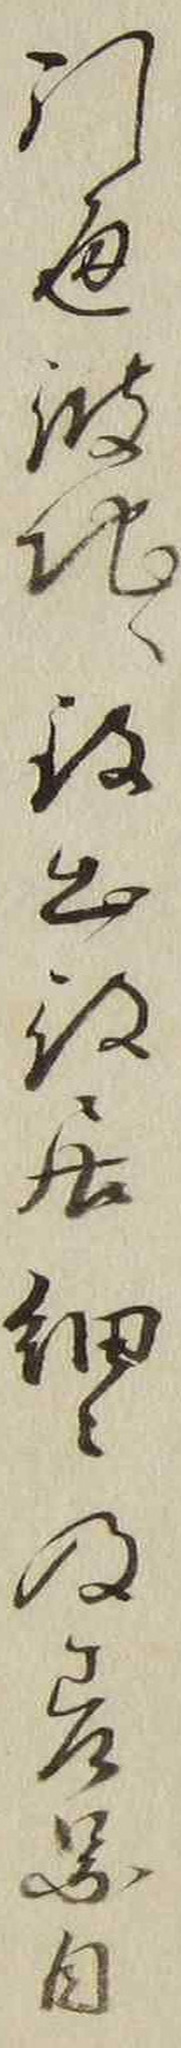引通彼地へ致出役居細々及差図自
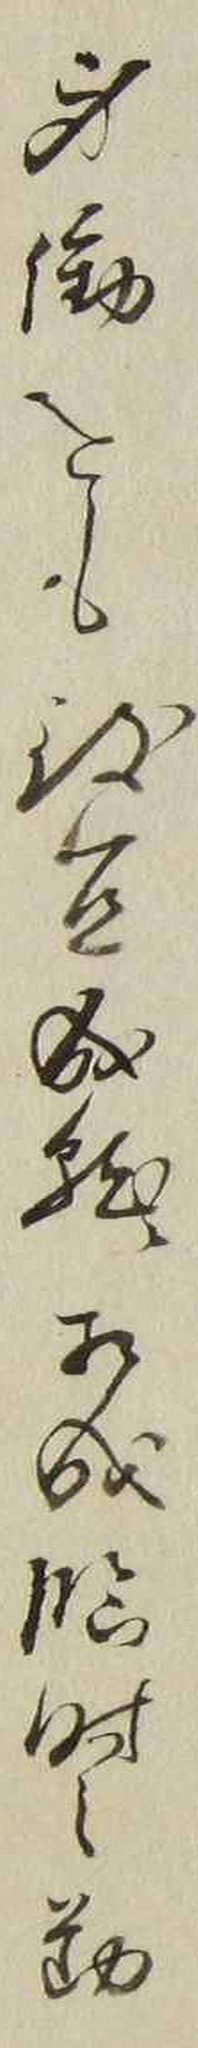身働をも致宜成就ニ相成臨時之勤

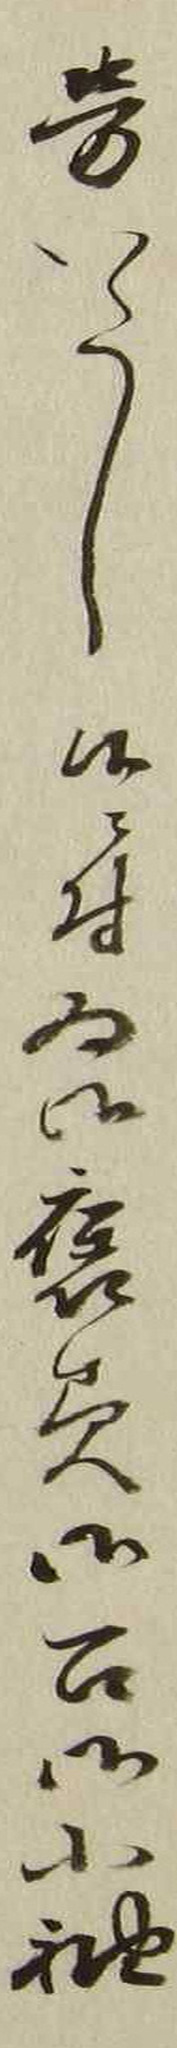労いたし候ニ付為御褒美御召御小袖
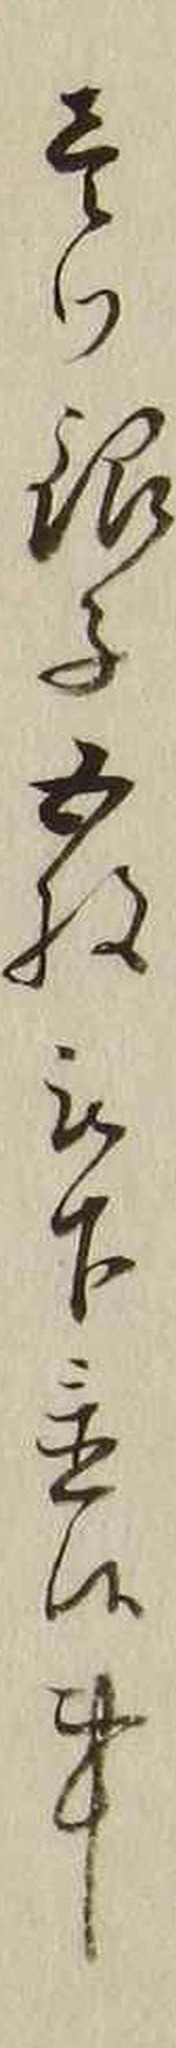壱ツ銀子五枚被下置候事
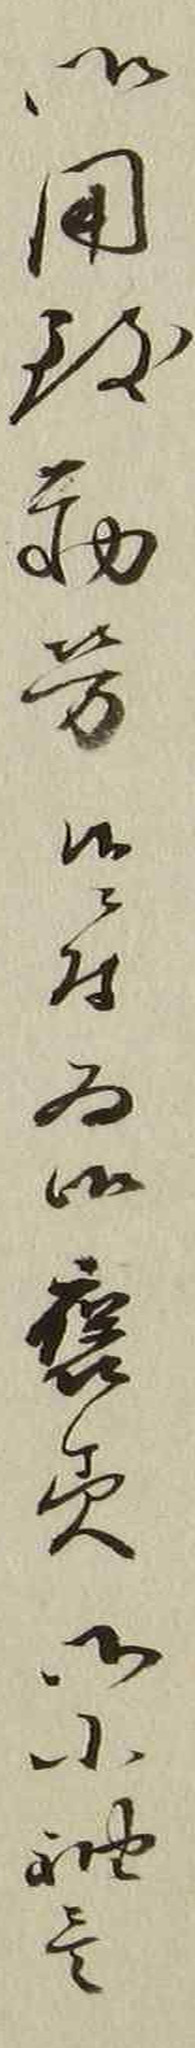御用致勤労候ニ付為御褒美御小袖壱
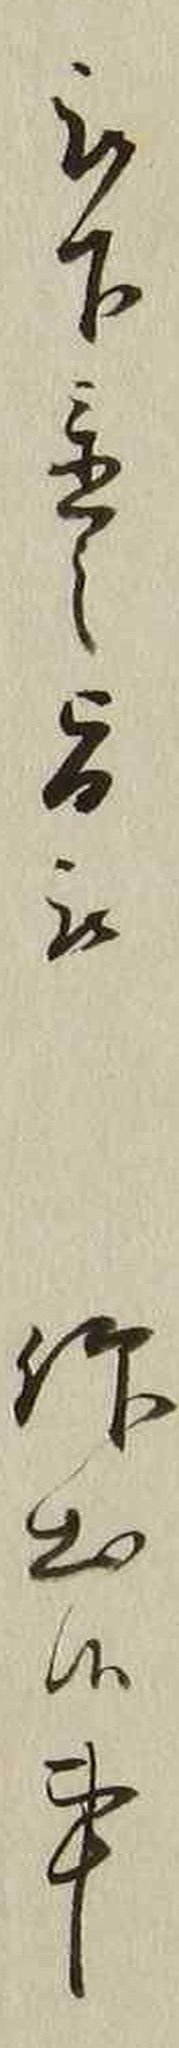被下置之旨被仰出候事
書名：諸士系譜　巻之52　に之部3
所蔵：会津若松市立会津図書館
